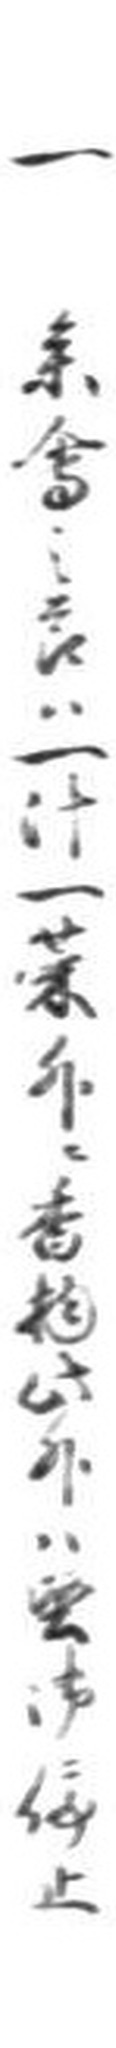一参会之節ハ一汁一菜外ニ香物此外ハ堅御停止
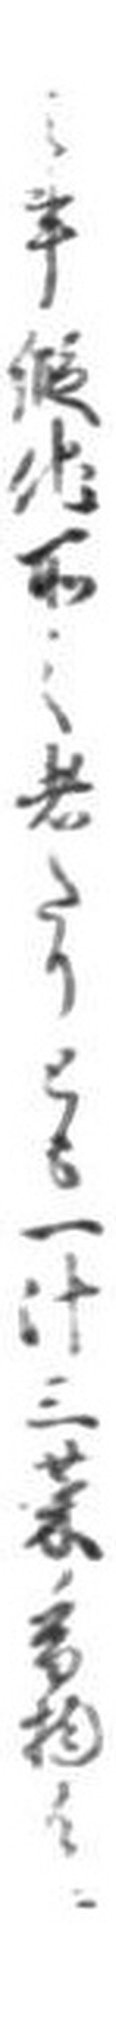之事縦他所之者たりとも一汁三菜香物共ニ
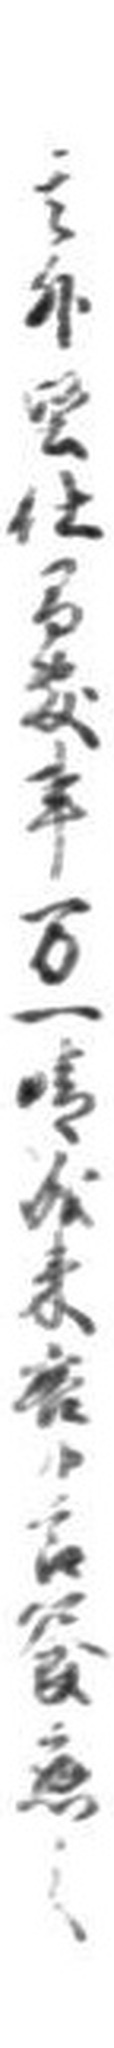其外堅仕間敷事万一晴成来客候節饗応之
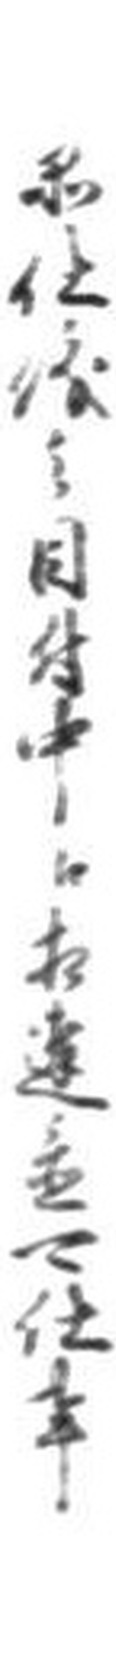品仕儀者目付中江相達置可仕事
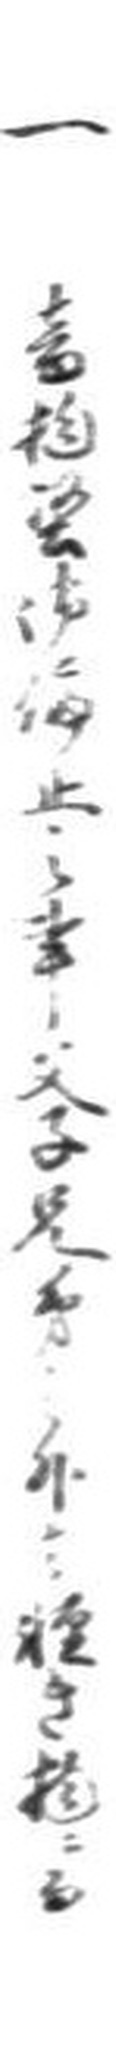一音物堅御停止之事父子兄弟之外者軽き物ニ而
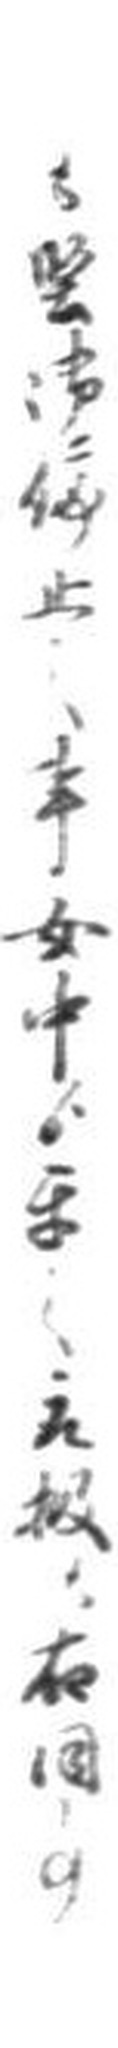も堅御停止之事女中ゟ互之取扱も右同事
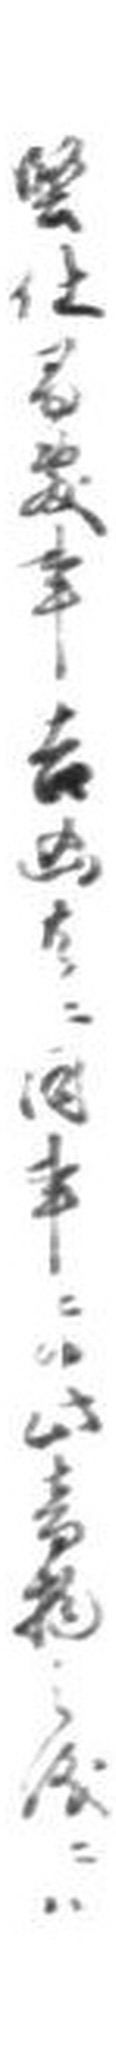堅仕間敷事吉凶共ニ同事ニ候此音物之儀ニハ
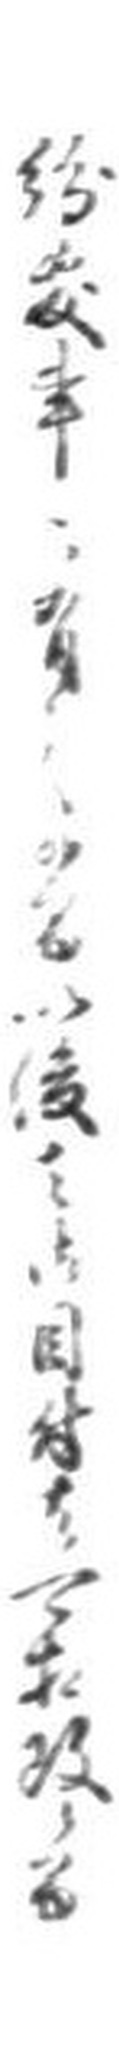紛敷事も有之候間以後者御目付共可相改候間
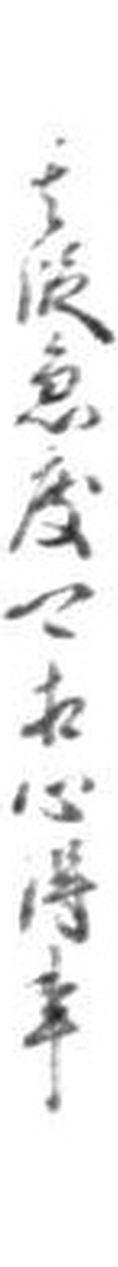其段急度可相心得事

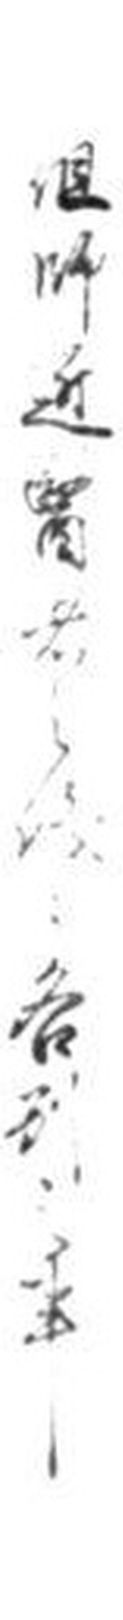但師匠医者之儀ハ各別之事
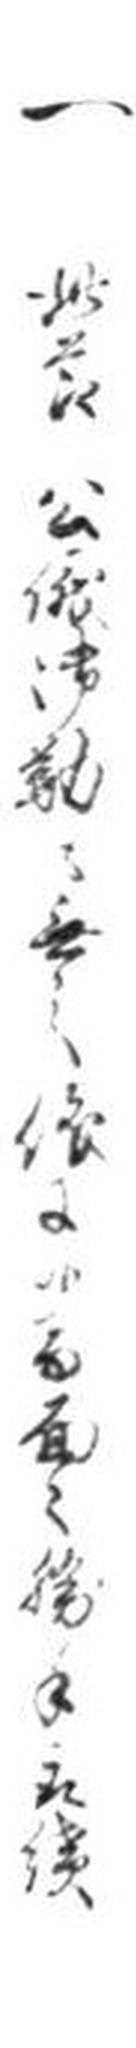一此節公儀御勤も無之儀に候間面々勝手取続
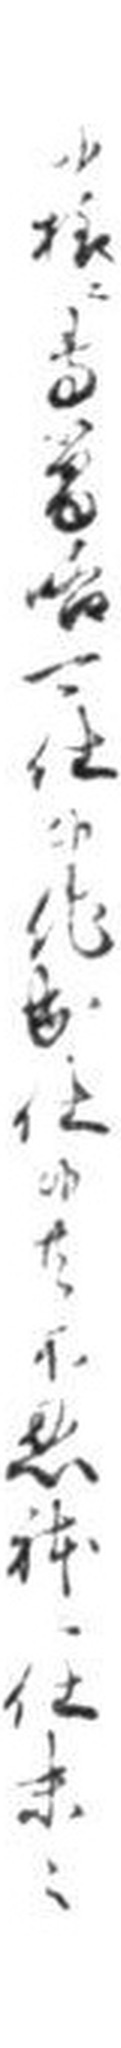候様ニ専簡略可仕候他出仕候共不忍体ニ仕末々
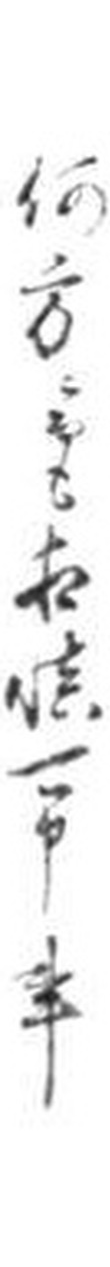何方ニ而も相慎可申事
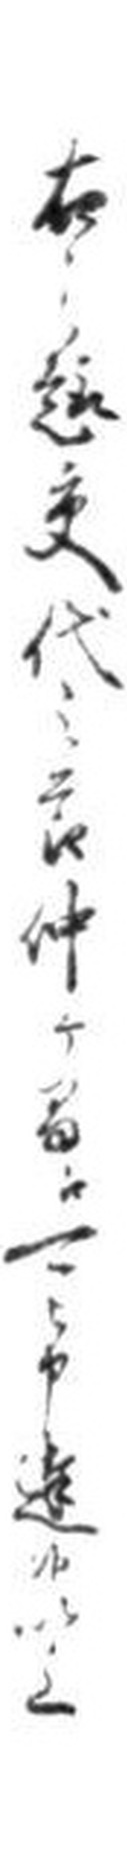右之趣交代之節仲ケ間江可被申達候以上
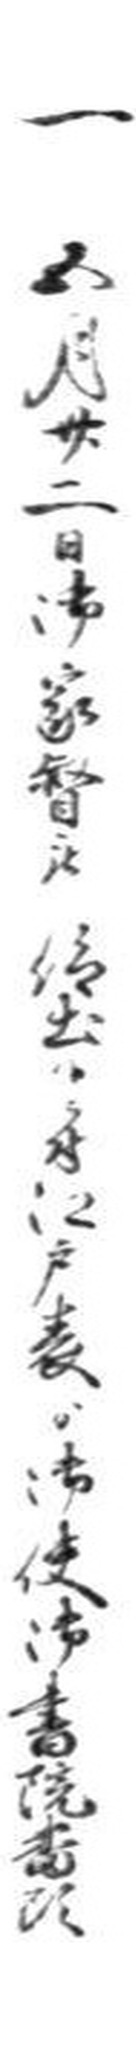一五月廿二日御家督被仰出候ニ付江戸表ゟ御使御書院番頭
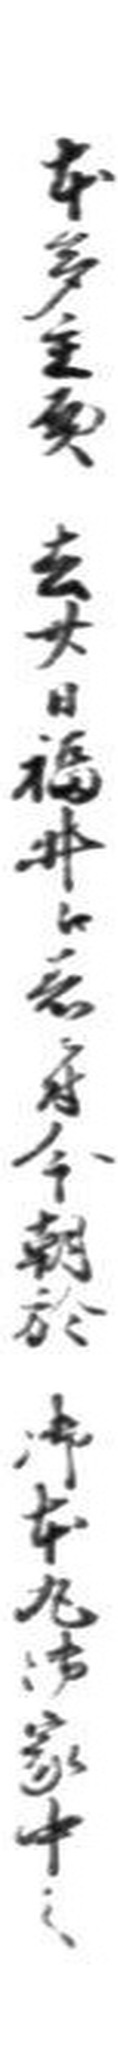本多主殿去廿日福井江着ニ付今朝於御本丸御家中之
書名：家譜 三十八 宗矩公 従享保九年五月到享保九年十二月
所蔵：福井県文書館 Fukui Prefectural Archives
